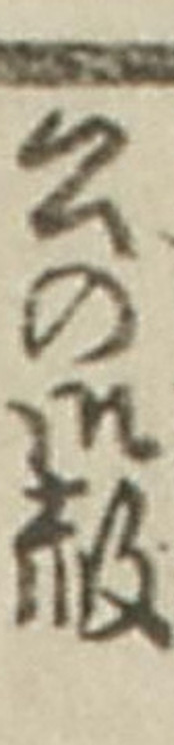公の御赦
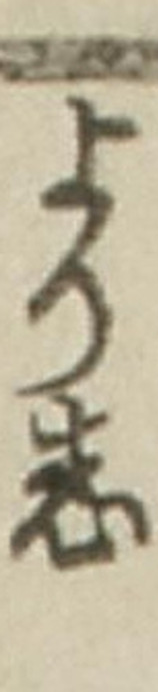より志
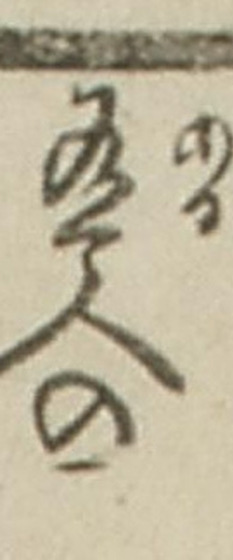有人の
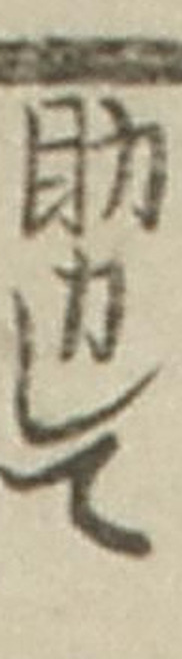助力して
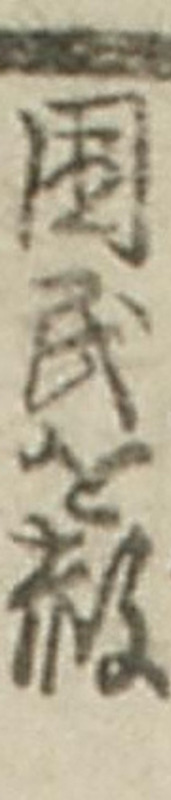困民を赦
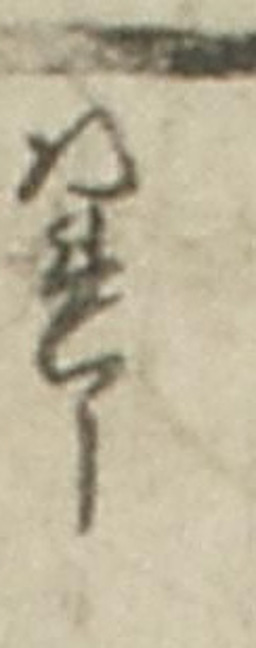はれし

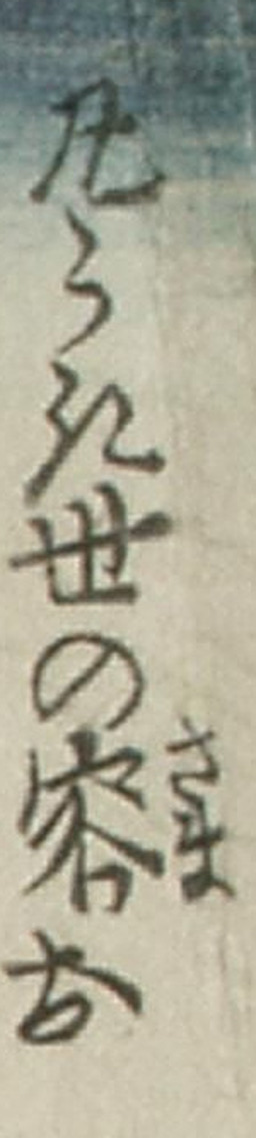凡うき世の容お
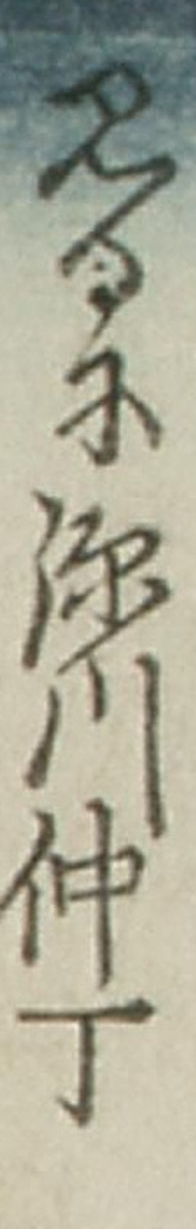見るに深川仲丁
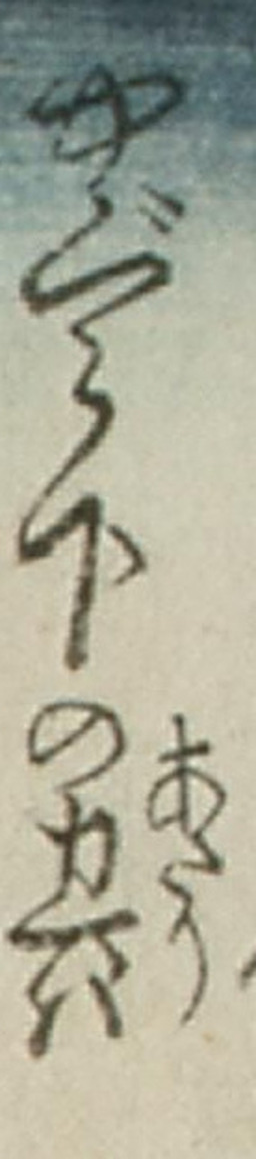やぐら下の辺は
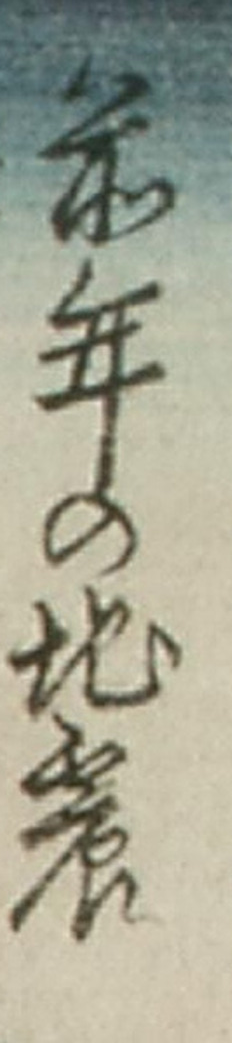前年の地震
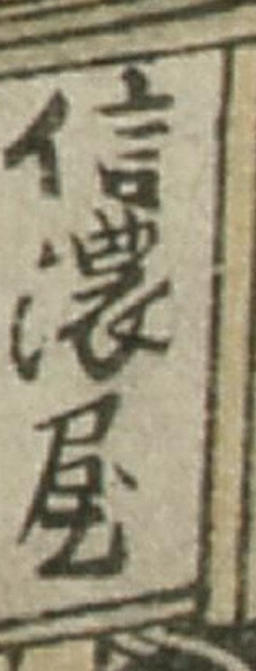信濃屋
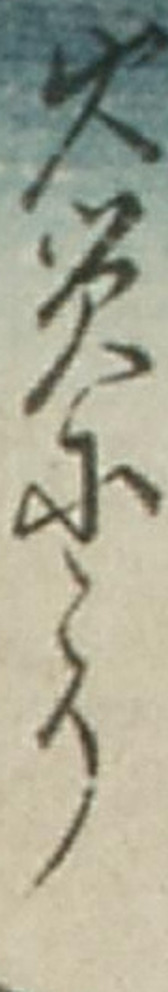火災にこり
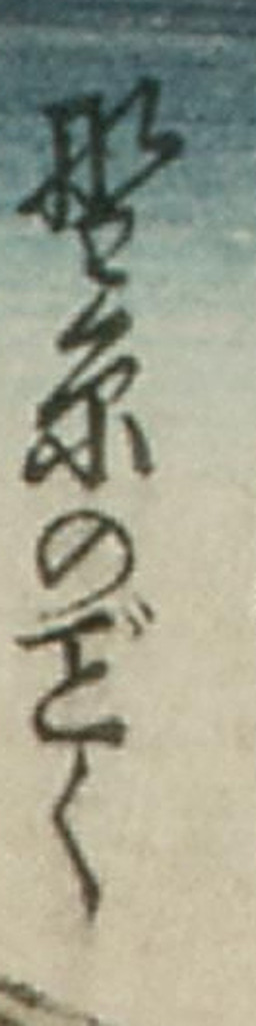野原のごとく
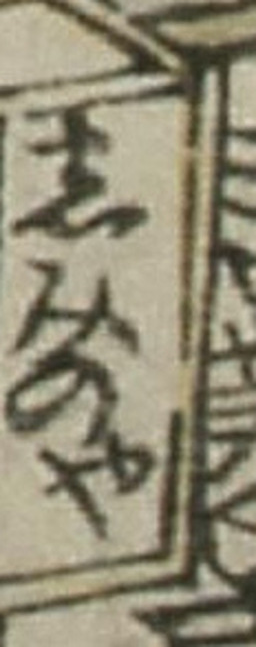しみのや
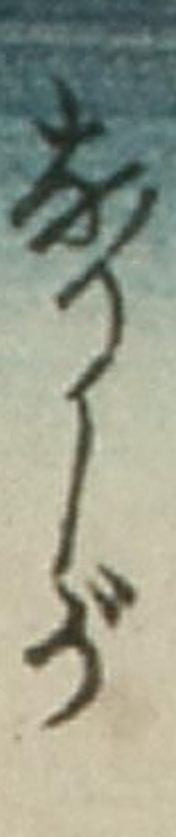なりしが
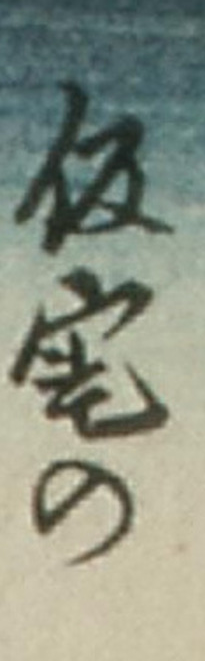仮宅の
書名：安政見聞誌　上
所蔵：東京大学地震研究所図書室 Earthquake Research Institute Library, The University of Tokyo, JAPAN
